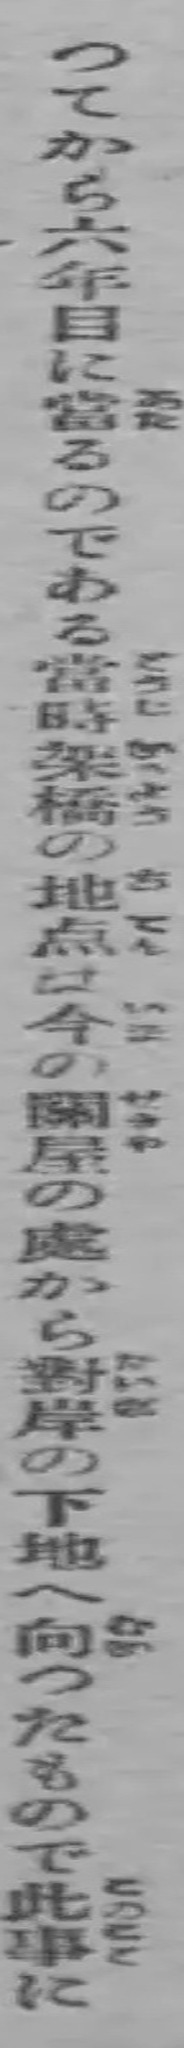つてから六年目に当るのである当時架橋の地点は今の関屋の処から対岸の下地へ向つたもので此事に
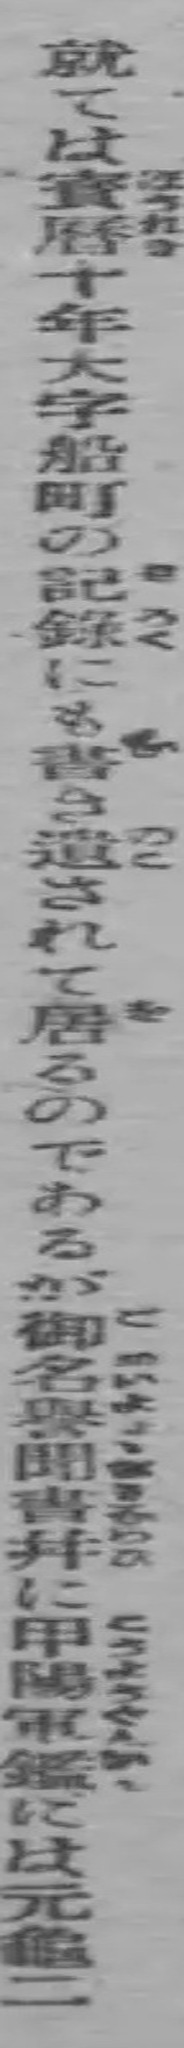就ては宝暦十年大字船町の記録にも書き遺されて居るのであるが御名誉聞書幷に甲陽軍鑑には元亀二
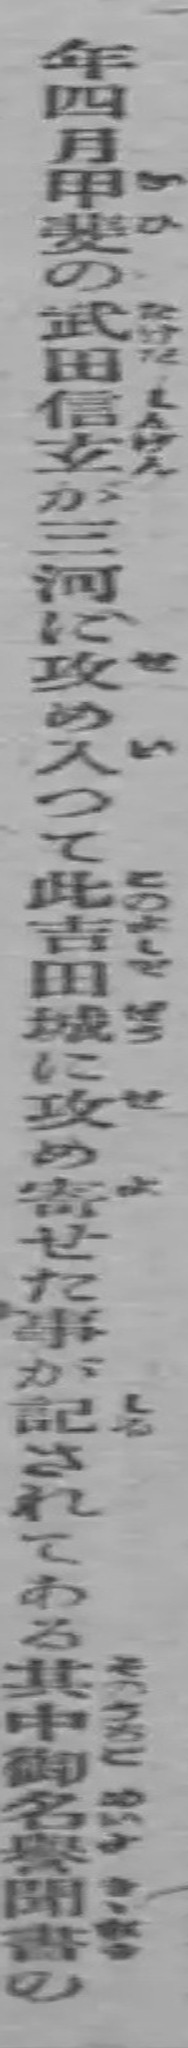年四月甲斐の武田信玄が三河に攻め入つて此吉田城に攻め寄せた事が記されてある其中御名誉聞書の
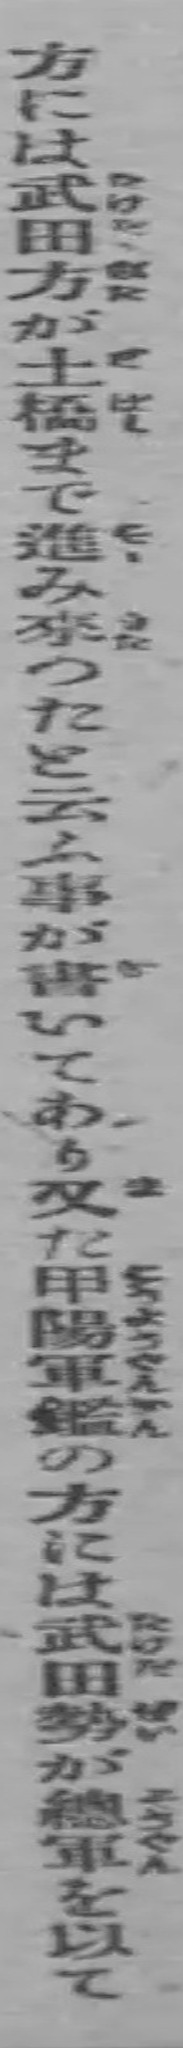方には武田方が土橋まで進み来つたと云ふ事が書いてあり又た甲陽軍鑑の方には武田勢が総軍を以て
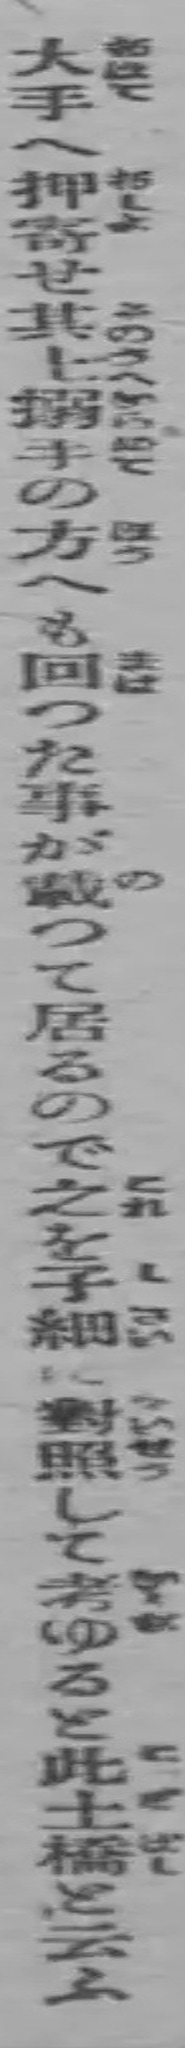大手へ押寄せ其上搦手の方へも回つた事が載つて居るので之を子細に対照して考ゆると此土橋と云ふ
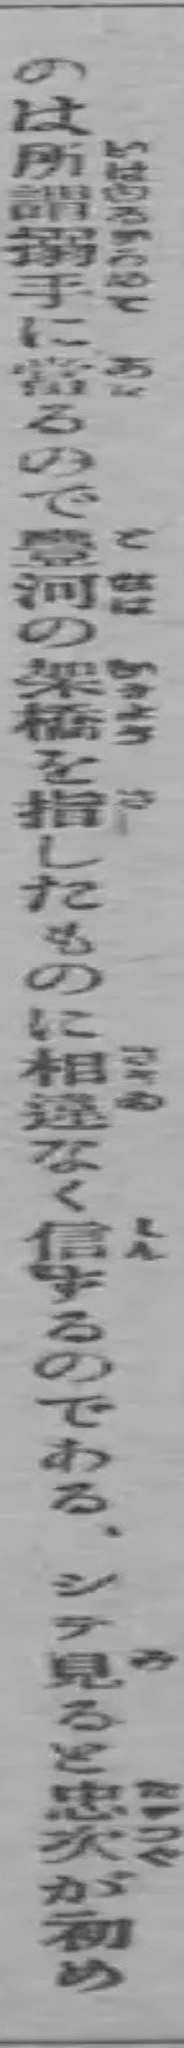のは所謂搦手に当るので豊河の架橋を指したものに相違なく信ずるのである、シテ見ると忠次が初め
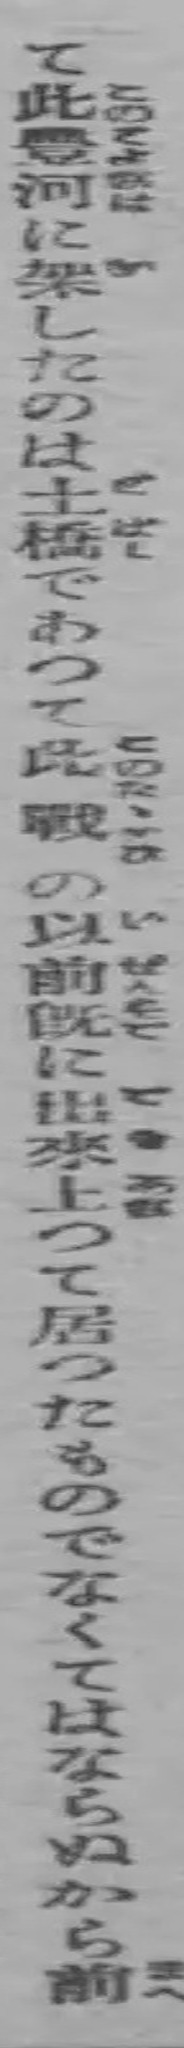て此豊河に架したのは土橋であつて此戦の以前既に出来上つて居つたものでなくてはならぬから前
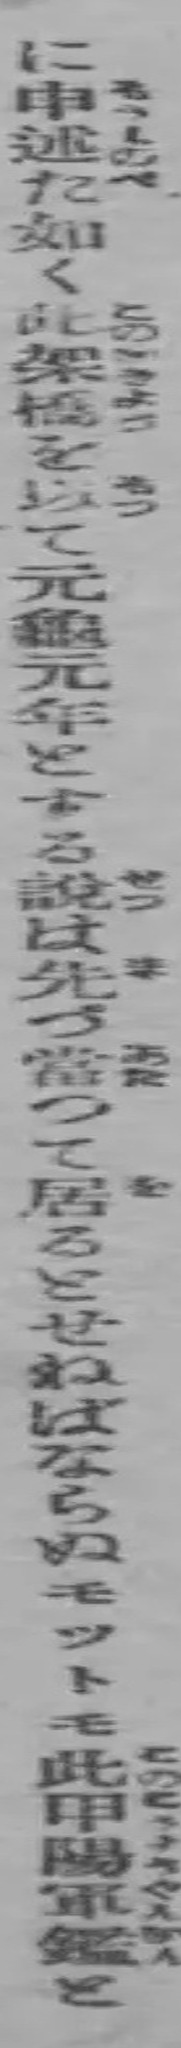に申述た如く此架橋を以て元亀元年とする説は先ずづ当つて居るとせねばならぬモツトモ此甲陽軍鑑と
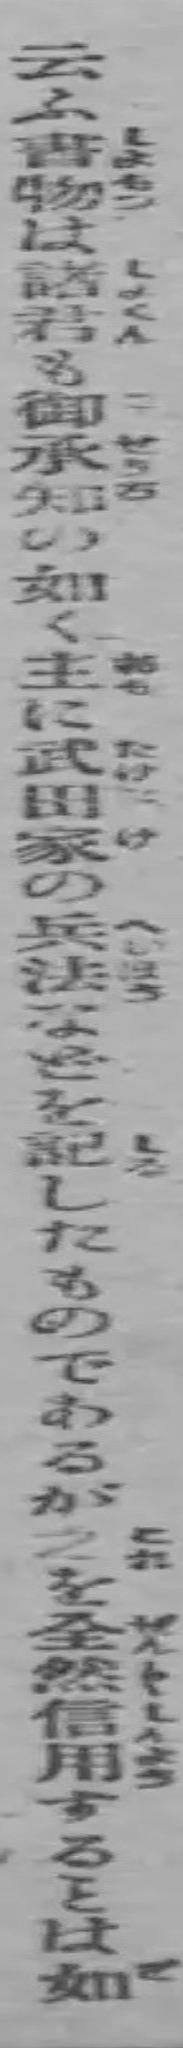云ふ書物は諸君も御承知の如く主に武田家の兵法などを記したものであるが之を全然信用することは如
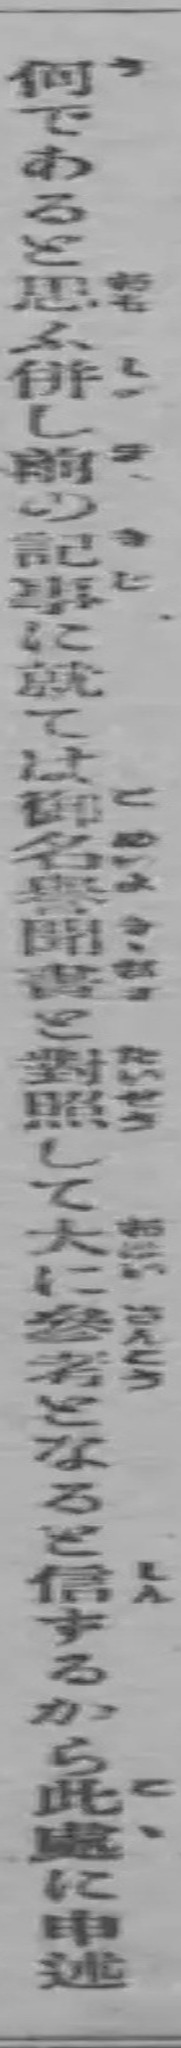何であると思ふ併し前の記事に就ては御名誉聞書と対照して大に参考となると信ずるから此処に申述
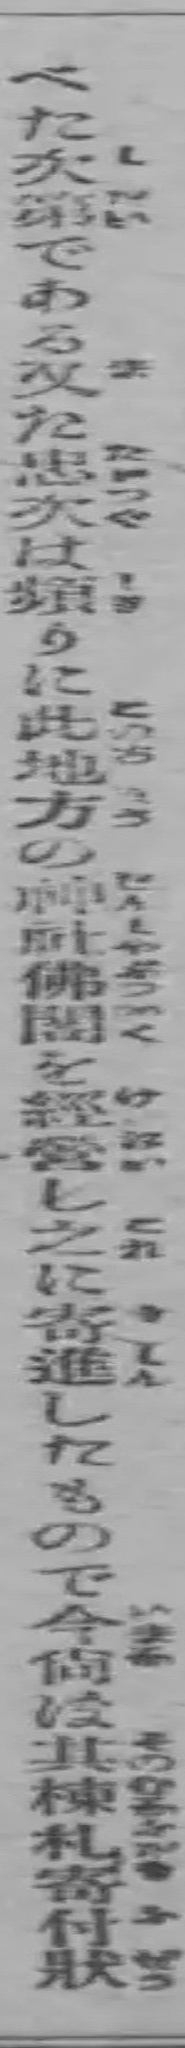べた次第である又た忠次は頻りに此地方の神社仏閣を経営し之に寄進したもので今尚ほ其棟札寄付状
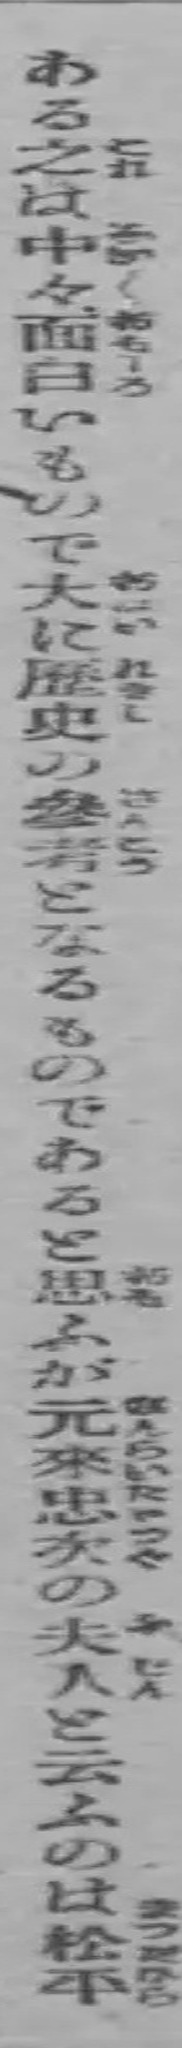ある之は中々面白いもので大に歴史の参考となるものであると思ふが元来忠次の夫人と云ふのは松平
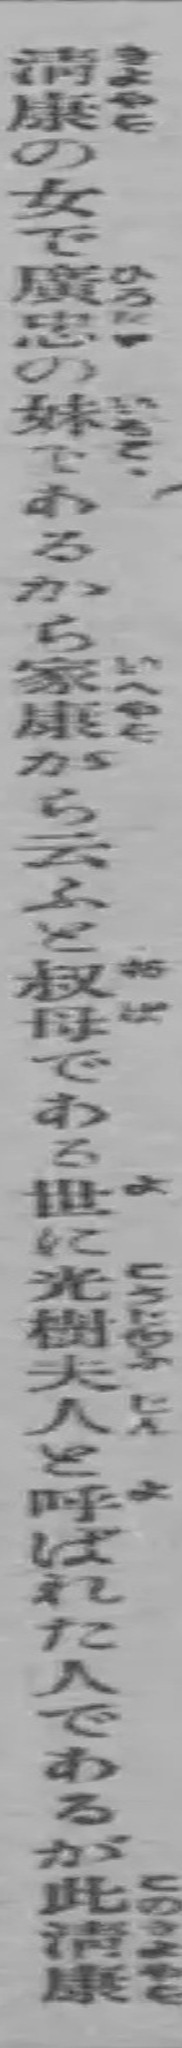清康の女で広忠の妹であるから家康から云ふと叔母である世に光樹夫人と呼ばれた人であるが此清康
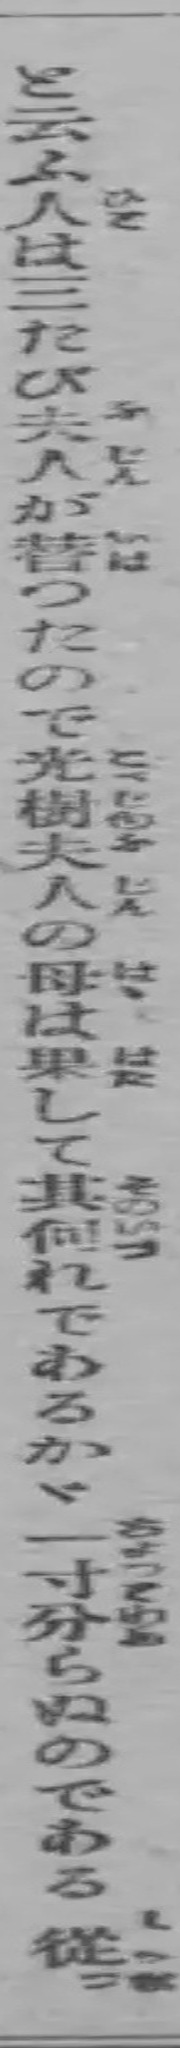と云ふ人は三たび夫人が替つたので光樹夫人の母は果して其何れであるかゞ一寸分らぬのである従
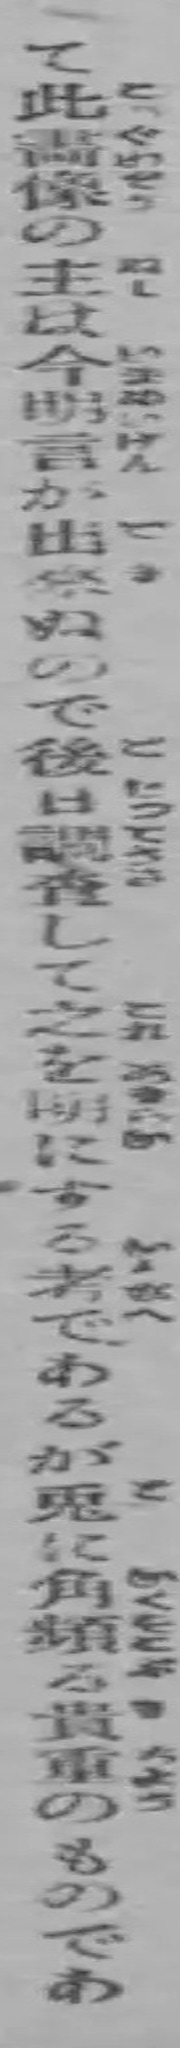て此画像の主は今明言が出来ぬので後日調査して之を明にする考であるが兎に角頗る貴重のものであ
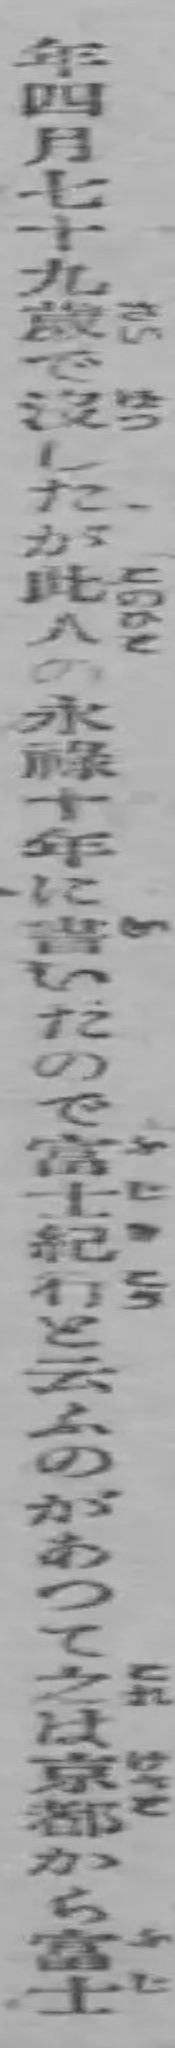年四月七十九歳で没したが此人の永禄十年に書いたので富士紀行と云ふのがあつて之は京都から富士
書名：豊橋市史談
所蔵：国立国会図書館 National Diet Library, JAPAN
